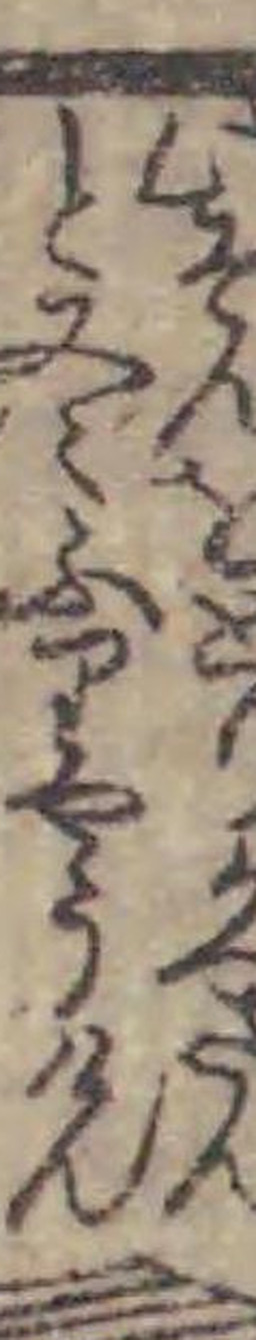と又々ふりやうけん
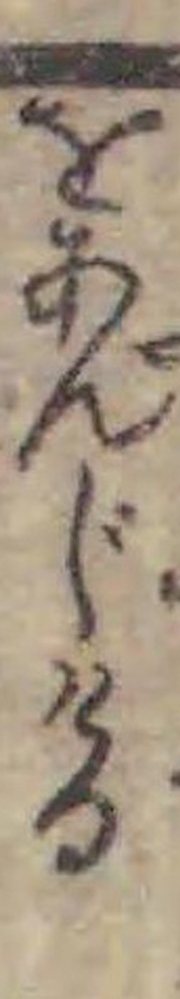をあんじける

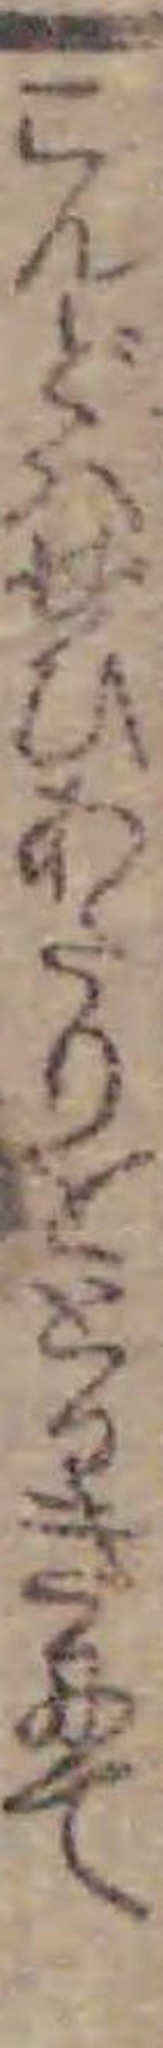こんどはぜひあたりをとるきにて
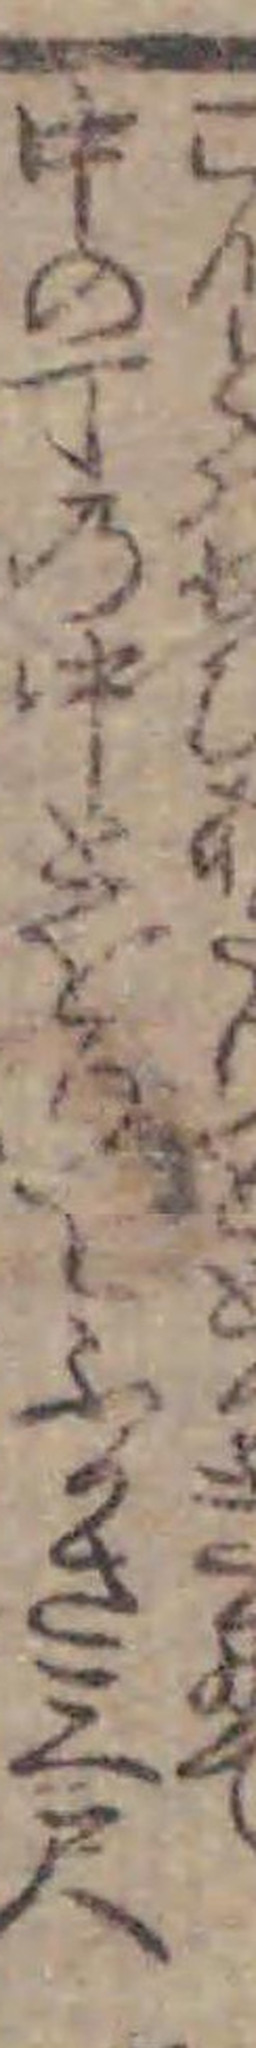中の丁の中とをりをふかさ三尺
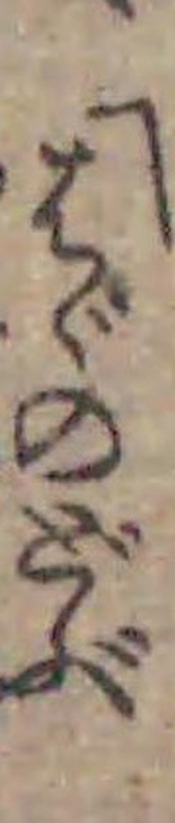〽はゞのどぶ
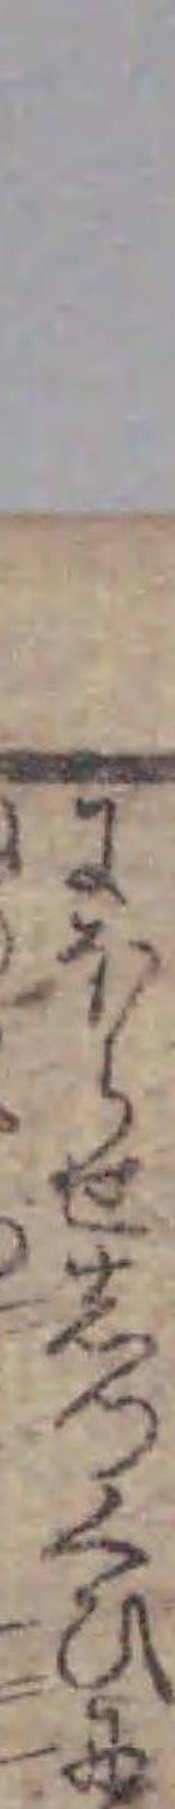にほらせしつくひにて
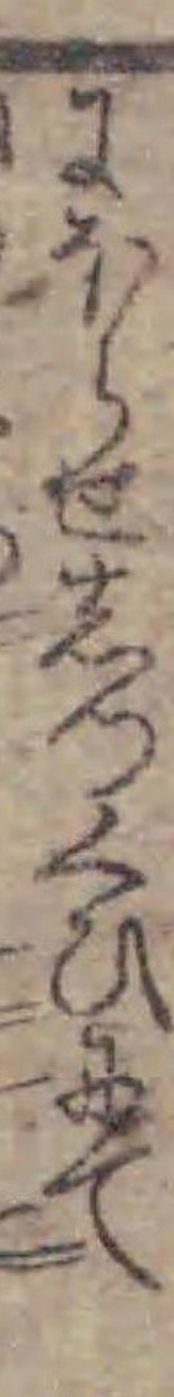にほらせしつくひにて
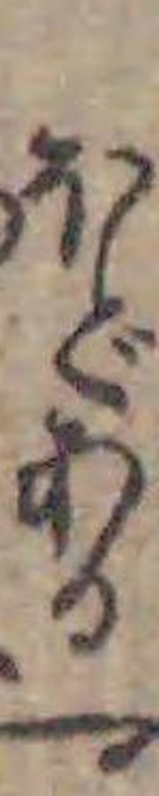ほどある
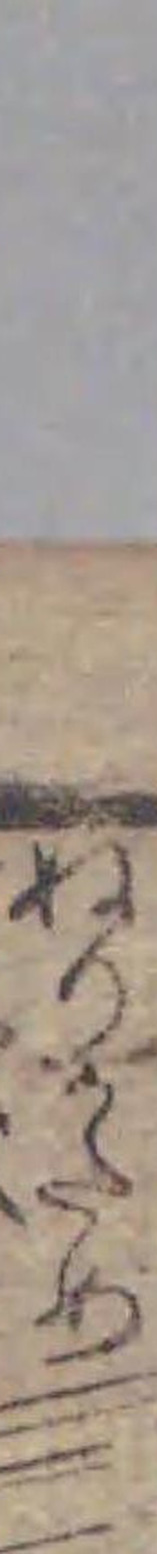ねりかため
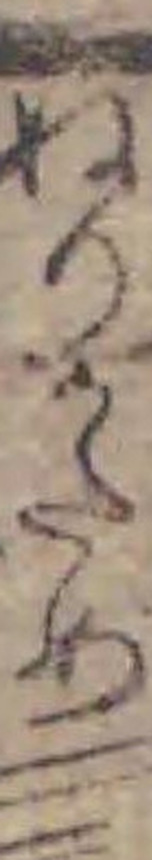ねりかため
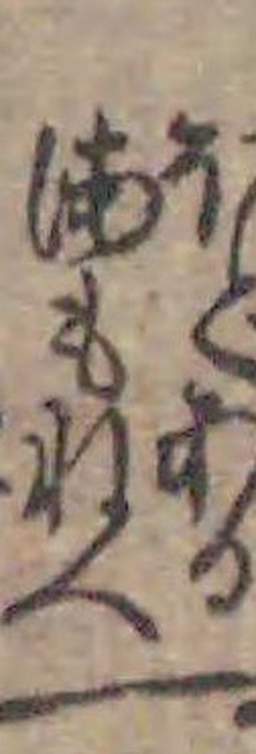海もねへ
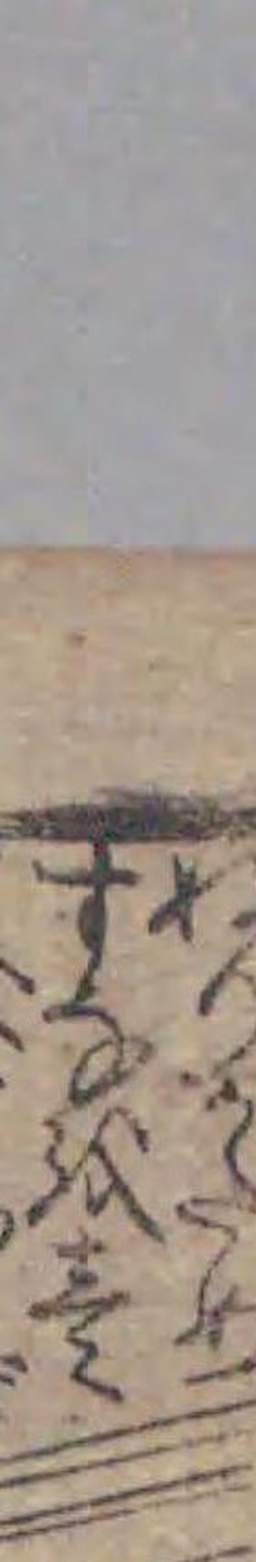すなを壱
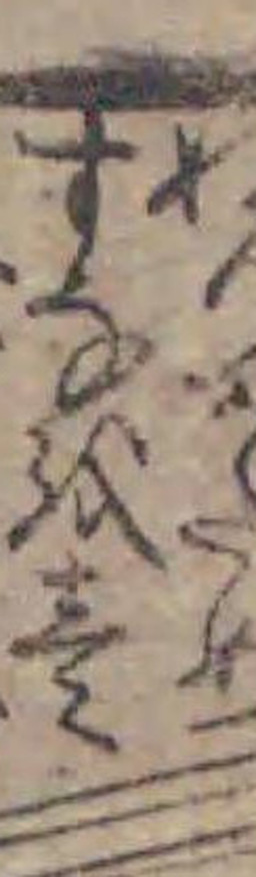すなを壱
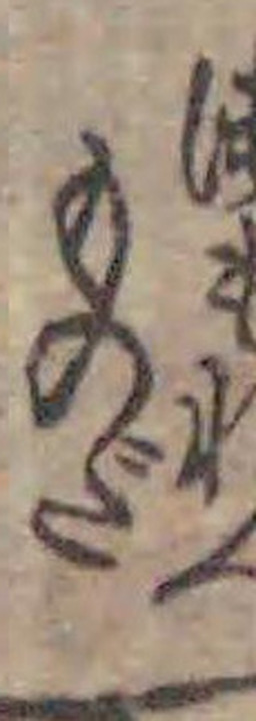ものだ
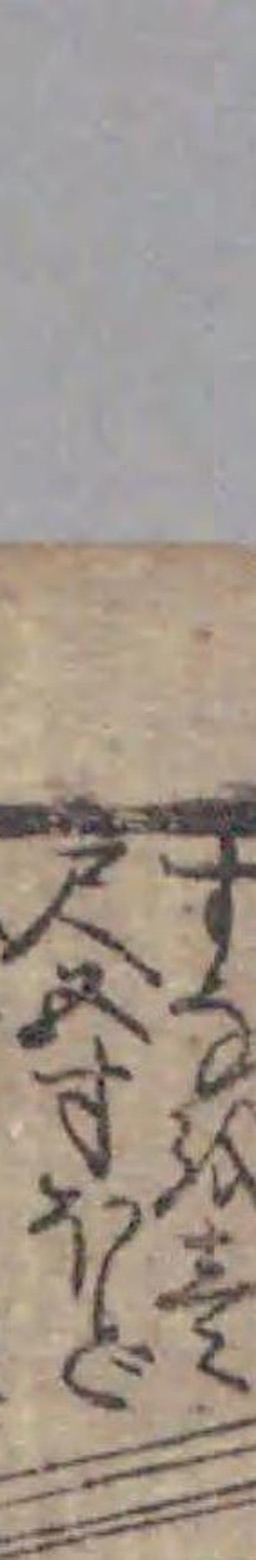尺五寸ほど
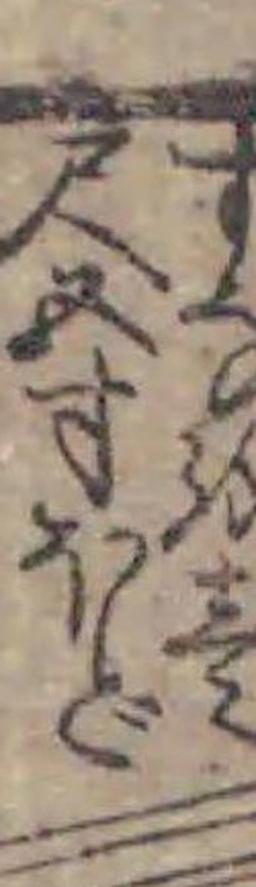尺五寸ほど
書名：本樹真猿浮気噺 : 3巻
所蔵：国立国会図書館 National Diet Library, JAPAN
